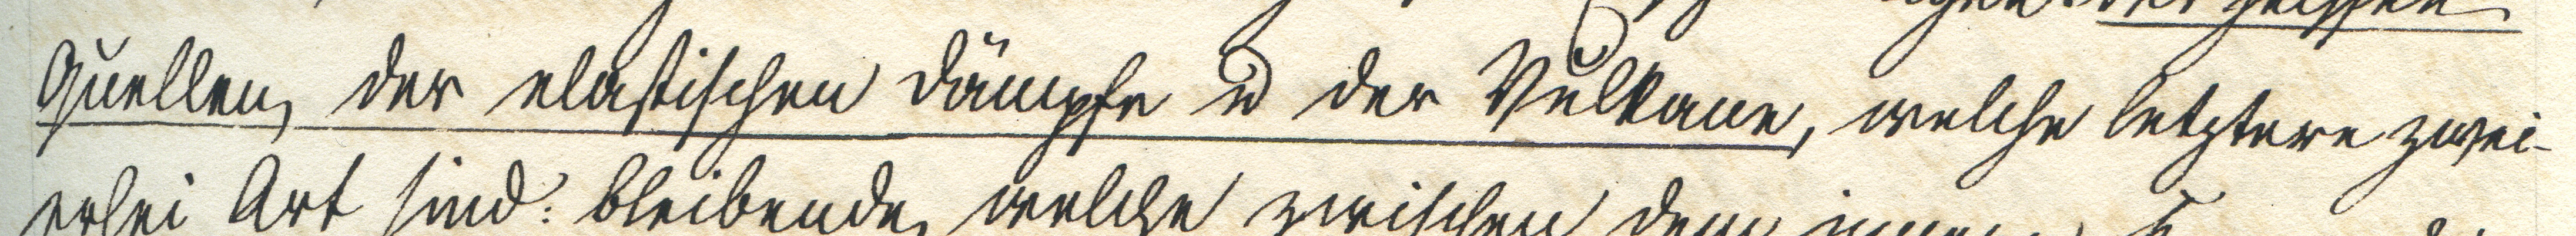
Quellen, der elastischen Dämpfe u der Vulkane, welche letztere zwei-
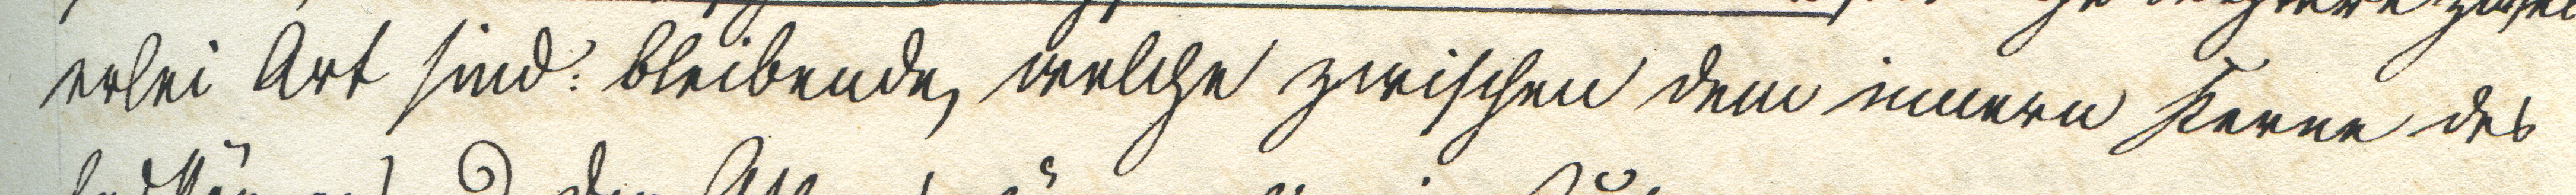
erlei Art sind: bleibende, welche zwischen dem innern Kerne des
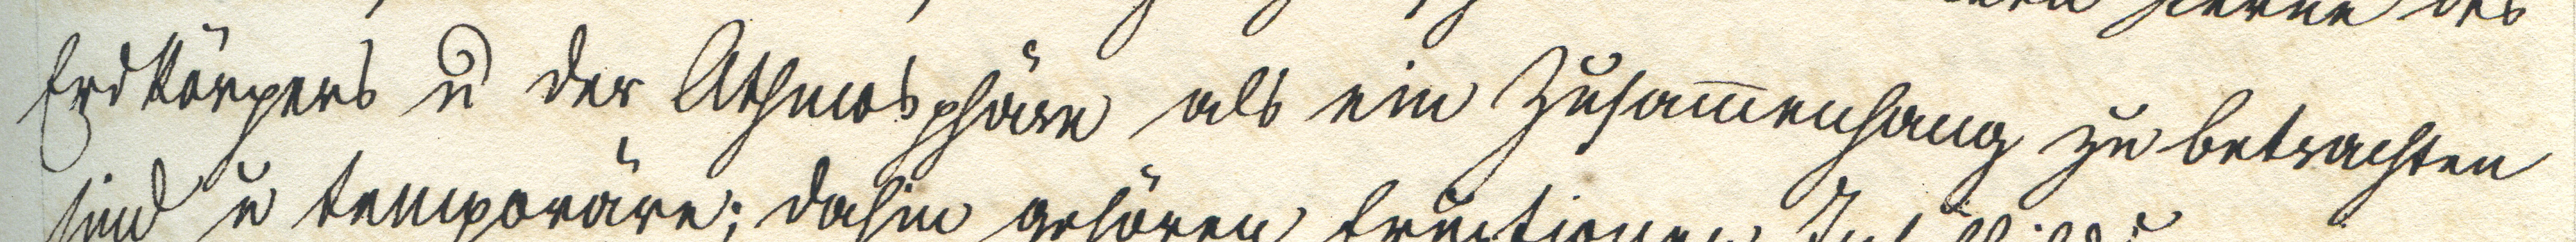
Erdkörpers u der Athmosphäre als ein Zusam̃enhang zu betrachten
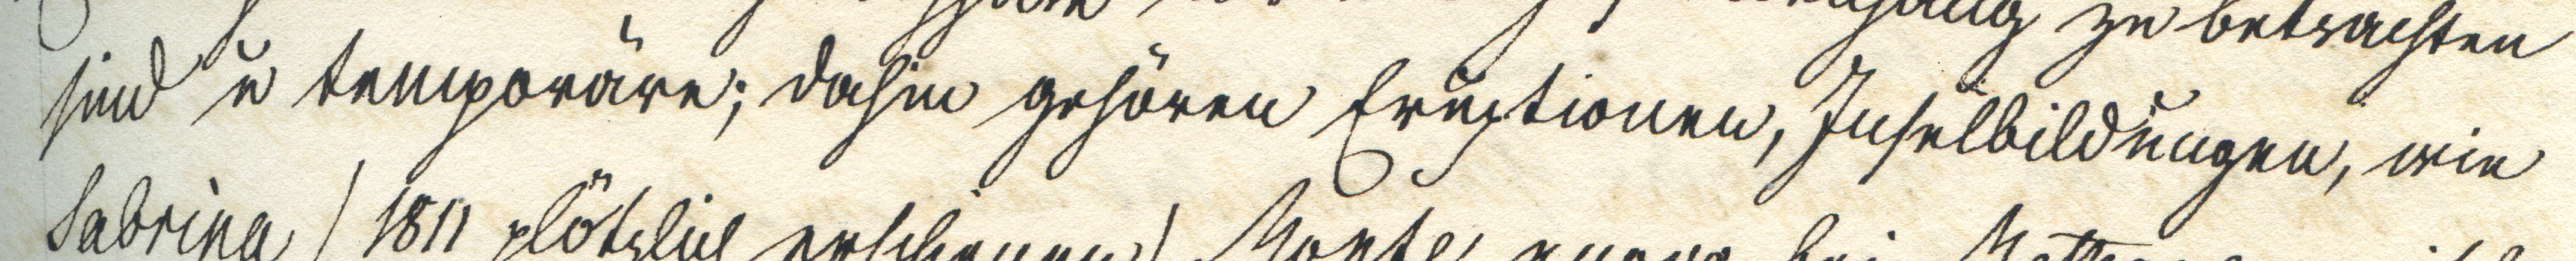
sind u temporäre; dahin gehören Eruptionen, Inselbildungen, wie
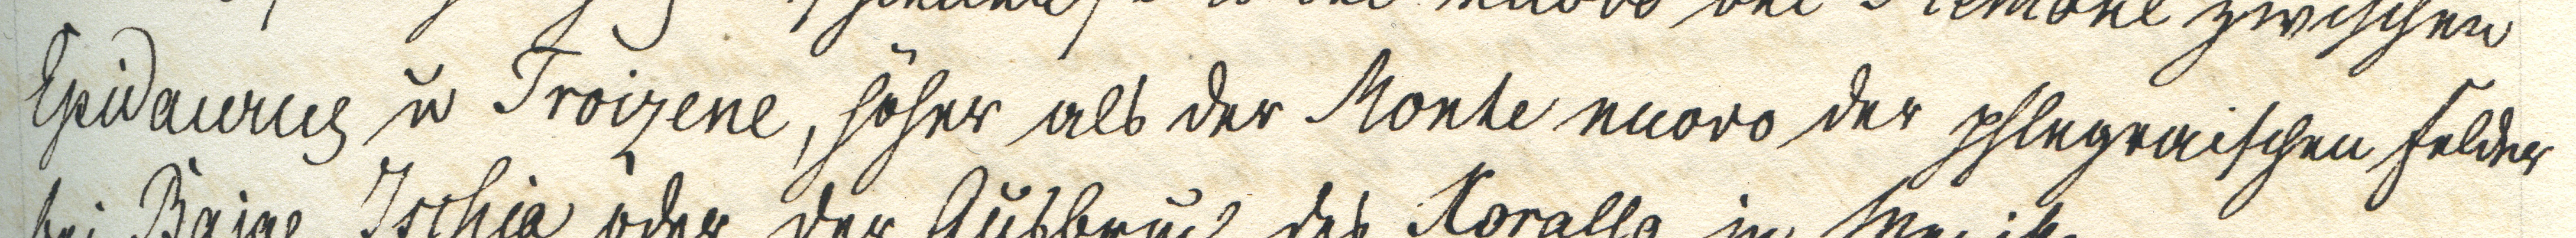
Epidaurus u Troizene, höher als der Monte nuovo der phlegraischen Felder
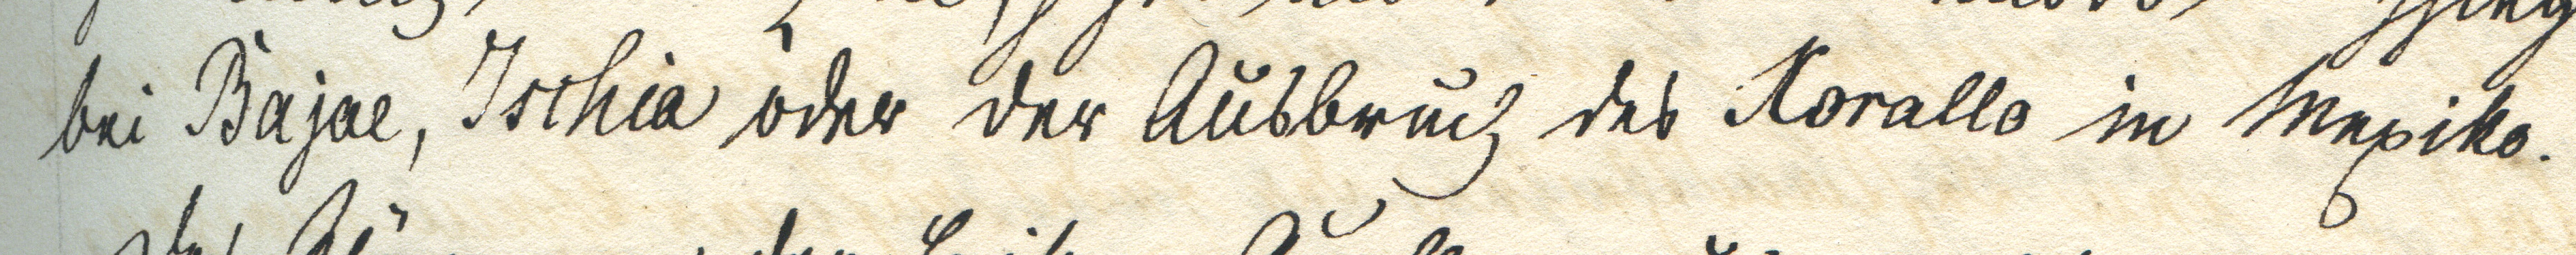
bei Bajae, Ischia oder der Ausbruch des Xorallo in Mexico.
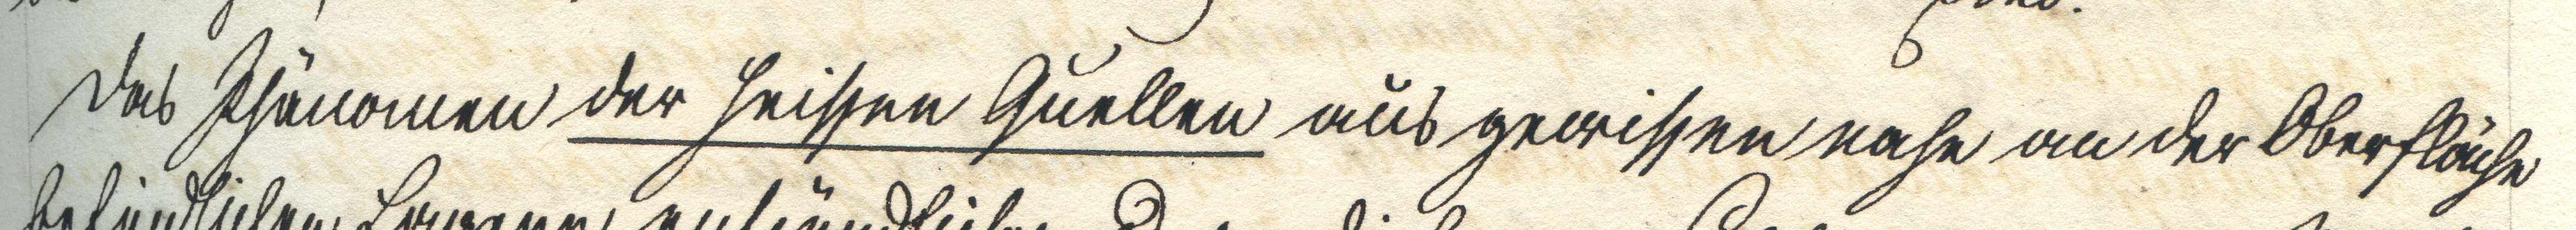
Das Phänomen der heissen Quellen aus gewissen nahe an der Oberfläche
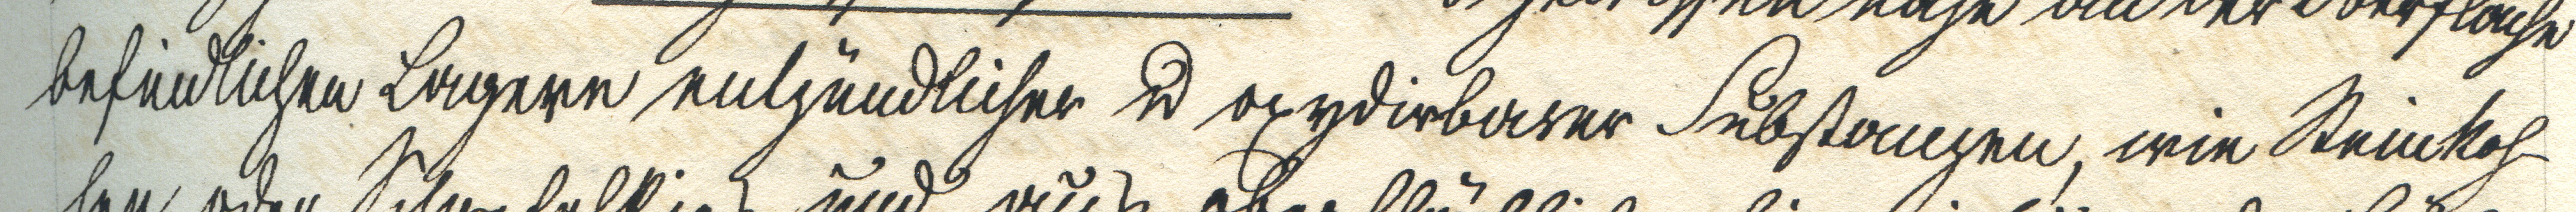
befindlichen Lagern entzündlicher u oxydirbarer Substanzen, wie Steinkoh-
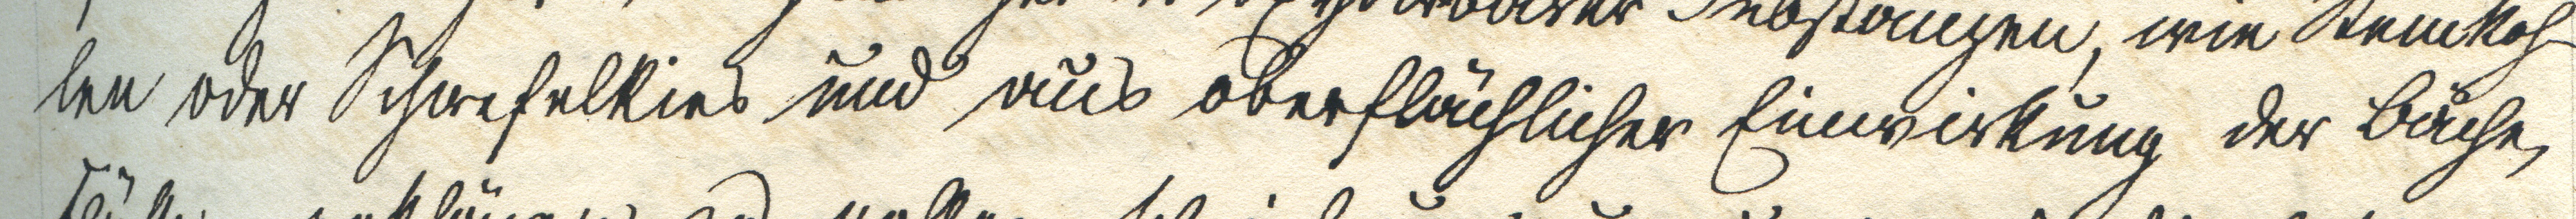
len oder Schwefelkies und aus oberflächlicher Einwirkung der Bäche,
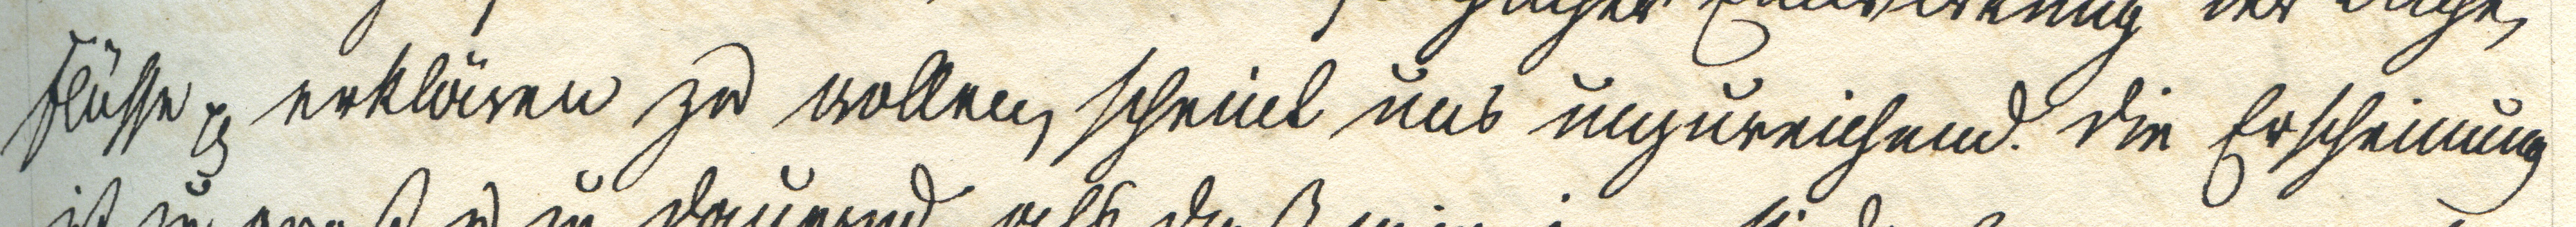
Flüsse ￼ erklären zu wollen, scheint uns unzureichend. Die Erscheinung
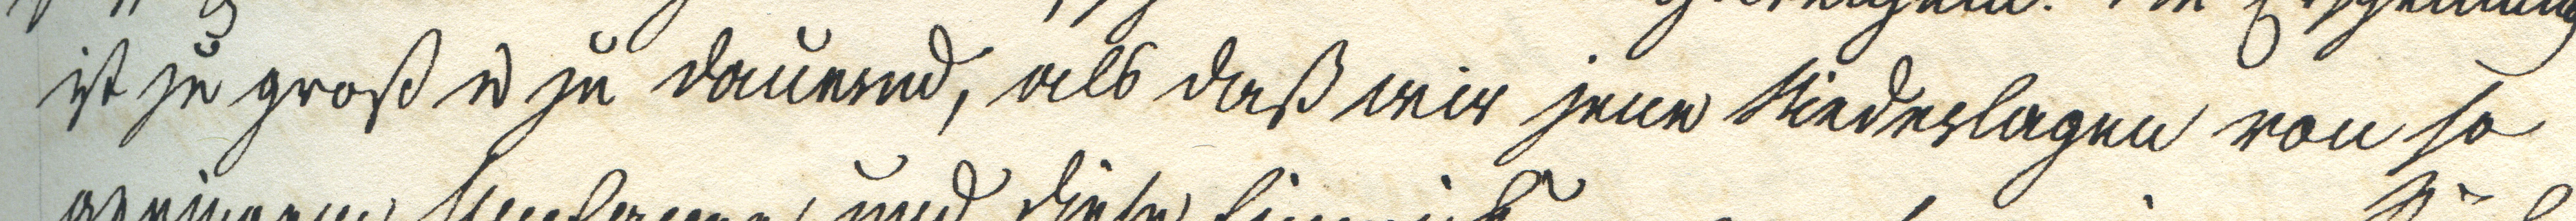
ist zu groß u zu dauernd, als daß wir jene Niederlagen von so
